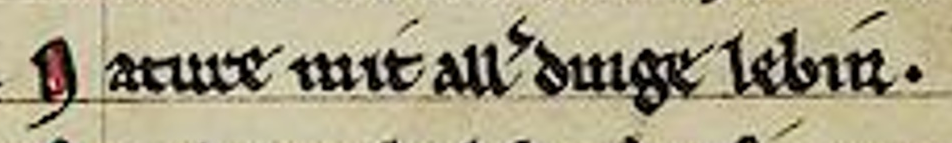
Nature mit all(er) dinge lebin.
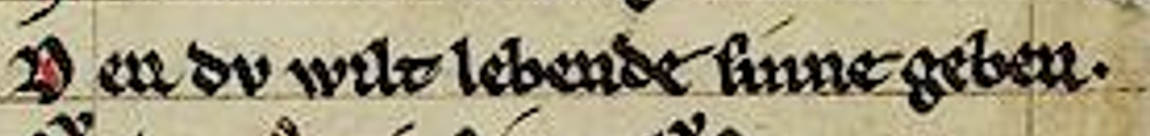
Den dv wilt lebende ſinne geben.
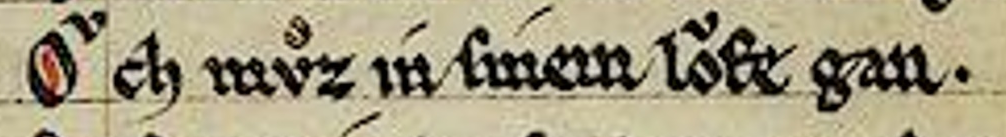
O°vch mv°oz in ſinem lo°vfe gan.
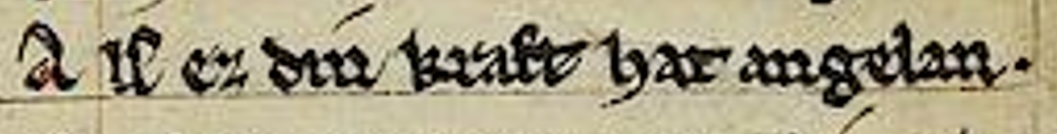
Alſ ez din kraft hat angelan.
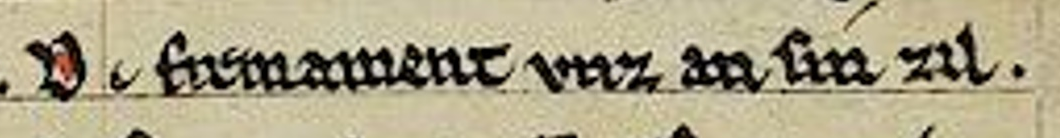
D(az) firmament vnz an ſin zil.
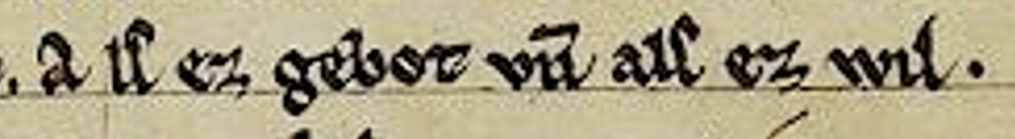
Alſ ez gebot vn(d) alſ ez wil.
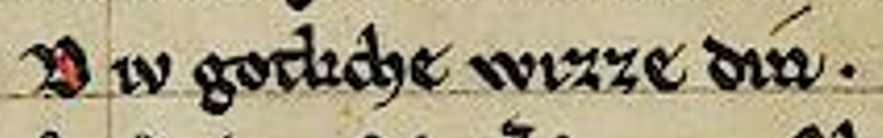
Div gotliche wizze din.
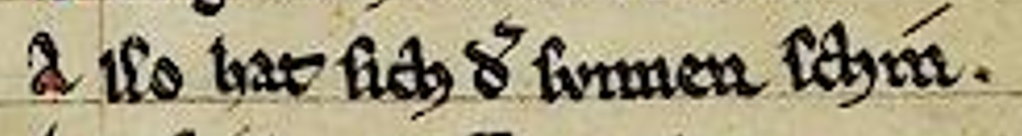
Alſo hat ſich d(er) ſvnnen ſchin.
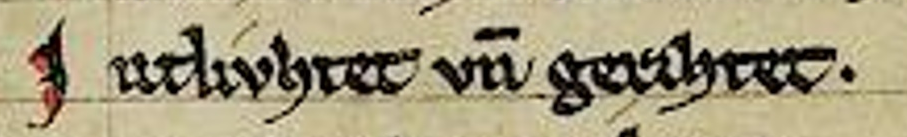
Intlivhtet vn(d) gerihtet.
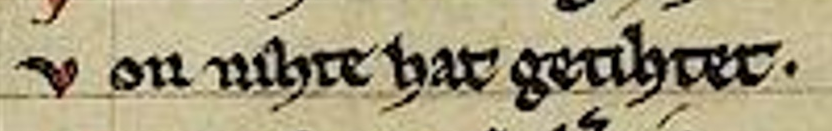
Von nihte hat getihtet.
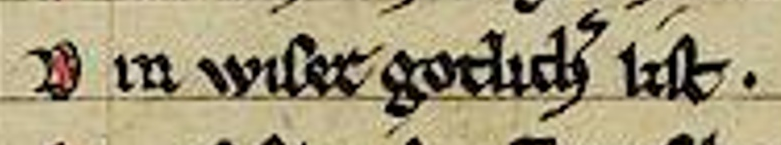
Din wiſer gotlich(er) liſt.
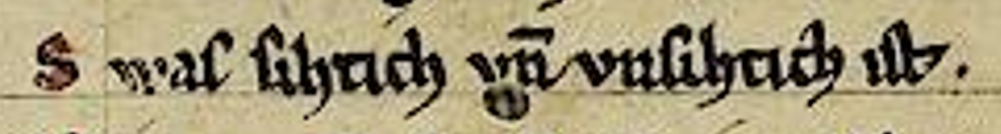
Swaſ ſihtich vn(d) vnſihtich iſt.
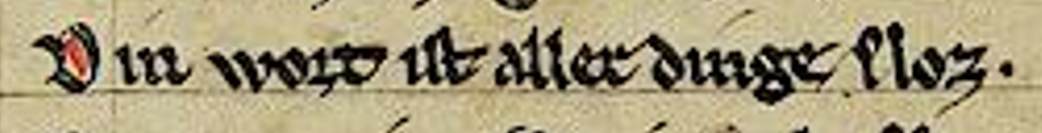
Din wort iſt aller dinge ſloz.
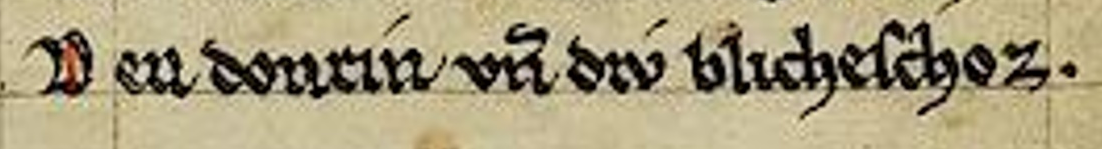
Den donrin vn(d) div blicheſchoz.
